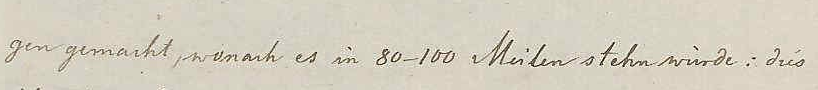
gen gemacht, wonach es in 80–100 Meilen stehn würde: dies
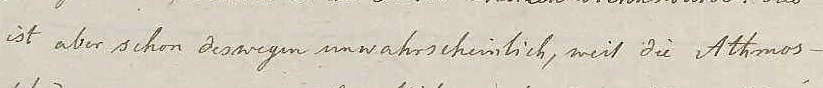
ist aber schon deswegen unwahrscheinlich, weil die Athmos-
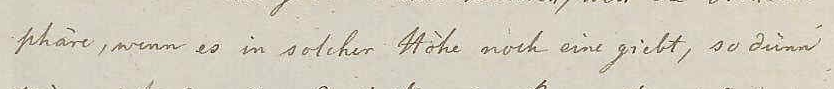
phäre, wenn es in solcher Höhe noch eine giebt, so dünn
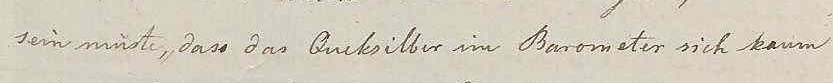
sein müste, dass das Queksilber im Barometer sich kaum
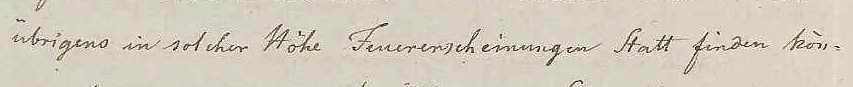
übrigens in solcher Höhe Feuererscheinungen Statt finden kön-
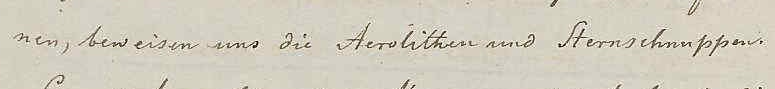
nen, beweisen uns die Aerolithen und Sternschnuppen.
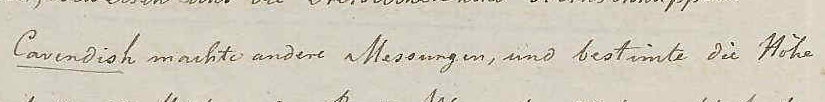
Cavendish machte andere Messungen, und bestimte die Höhe
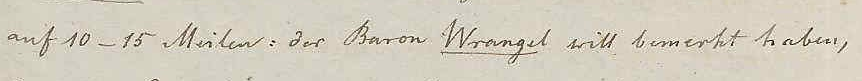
auf 10–15 Meilen: der Baron Wrangel will bemerkt haben,
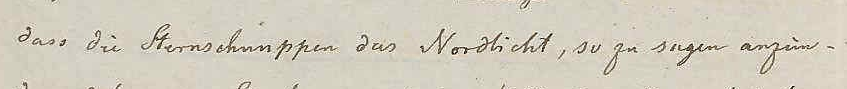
dass die Sternschnuppen das Nordlicht, so zu sagen anzün-
